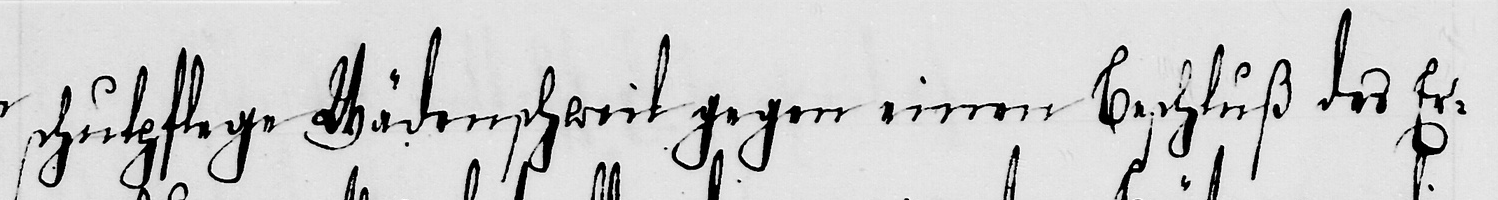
schulpflege Wädenschweil gegen einen Beschluß des Er¬
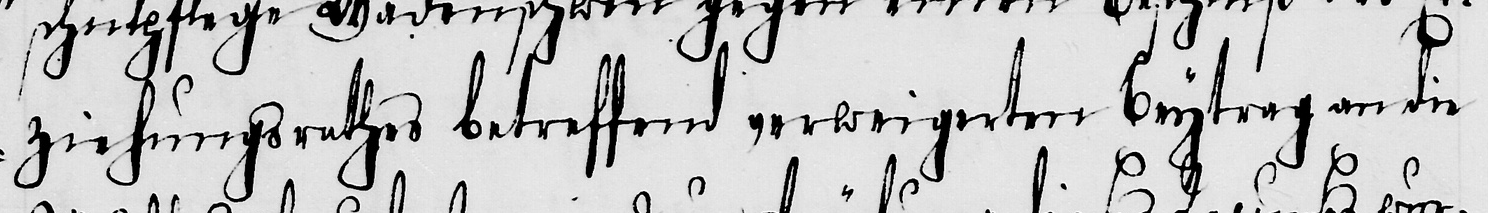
ziehungsrathes betreffend verweigerten Beytrag an die
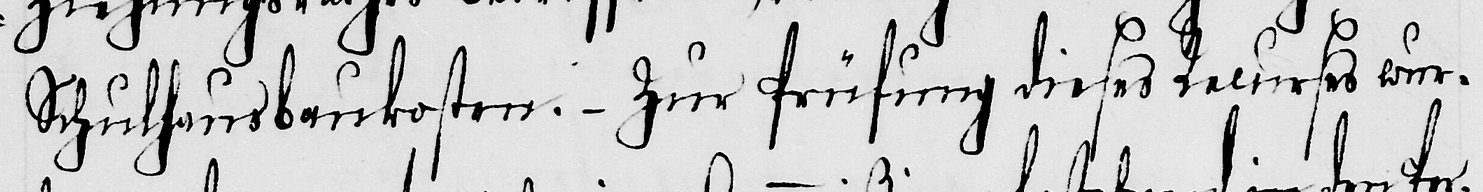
Schulhausbaukosten. – Zur Prüfung dieses Recurses wur¬
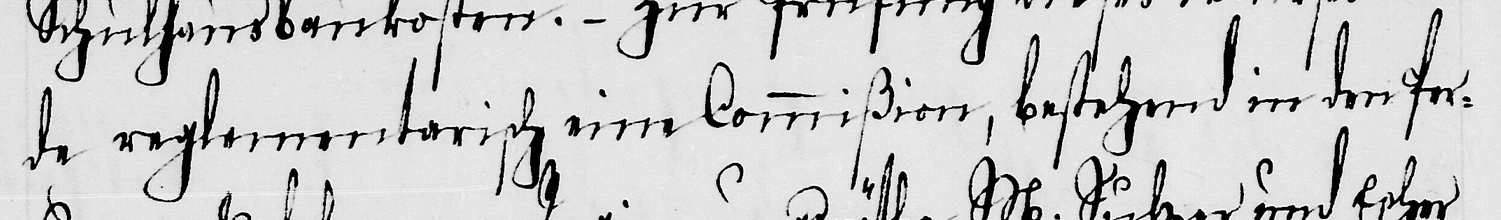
de reglementarisch eine Commißion, bestehend in den Per¬
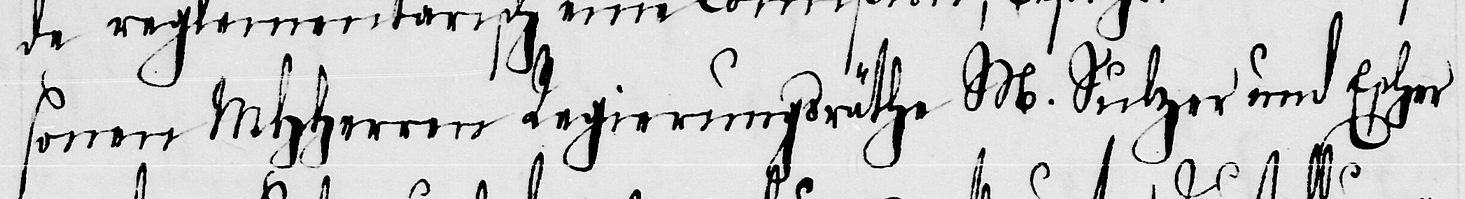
sonen MHHerren Regierungsräthe M. Sulzer und Escher
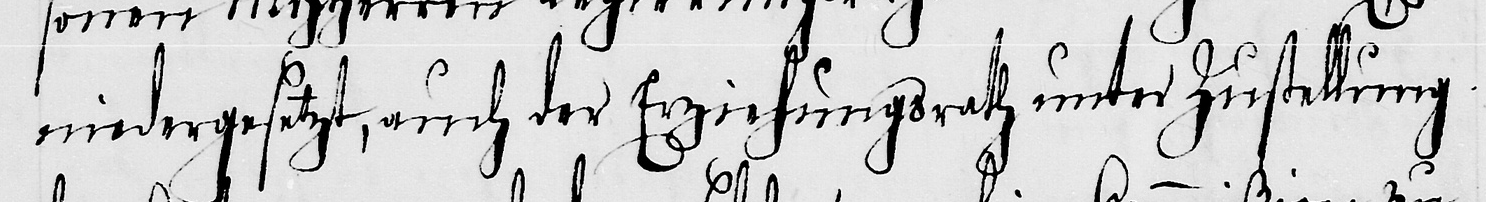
niedergesetzt, auch der Erziehungsrath unter Zustellung
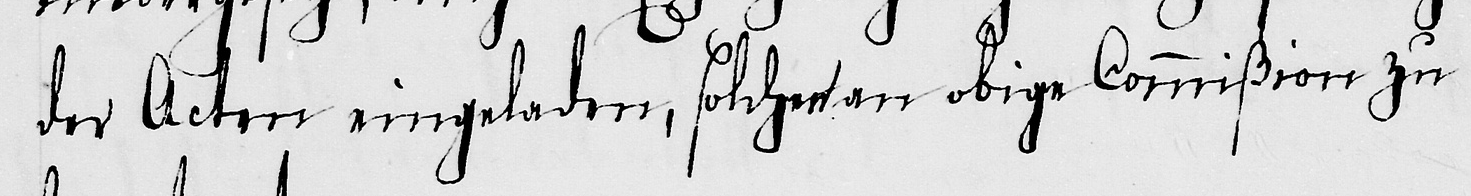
der Acten eingeladen, solchen an obige Commißion zu
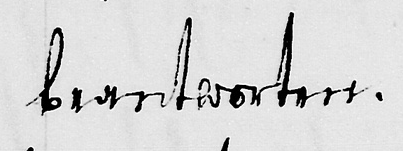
beantworten.
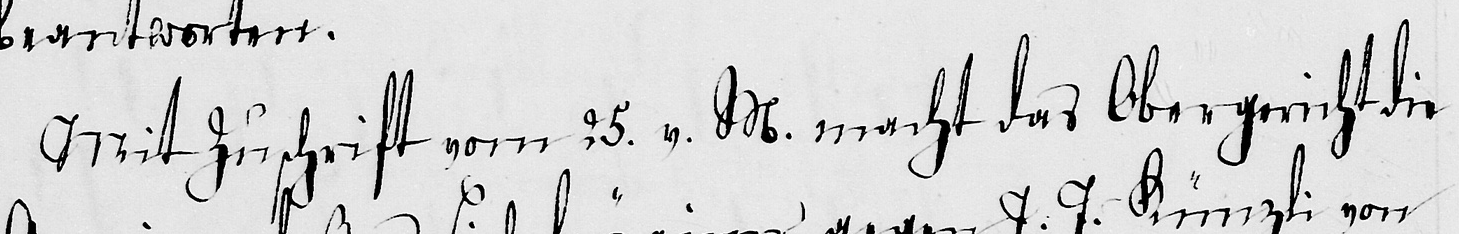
Mit Zuschrift vom 25. v. M. macht das Obergericht die
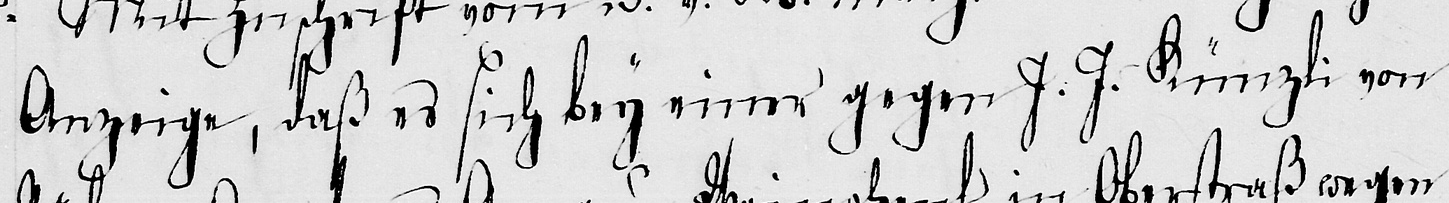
Anzeige, daß es sich bey einer gegen J. J. Künzli von
